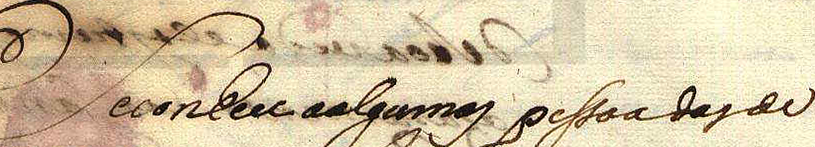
Se conhece a algumas pessoa das de
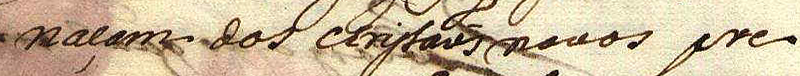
naçam dos christaõs nouos pre
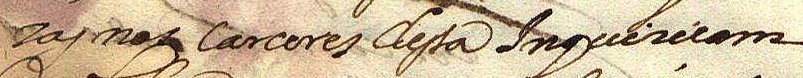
zas nos carceres desta Inquiziçam
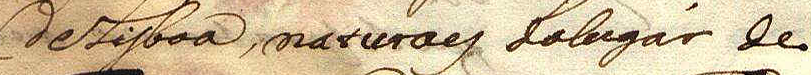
de Lisboa, naturaes do lugar de
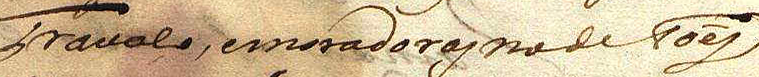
Trauaço, e moradoras no de Toẽs
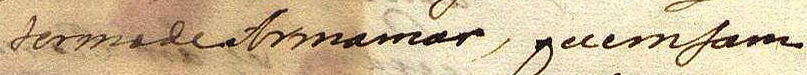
termo de Armamar, quem sam
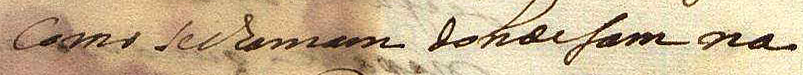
como se chamam donde sam na
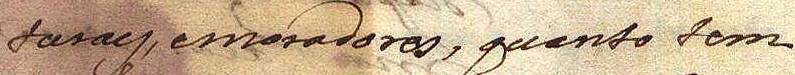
turaes, e moradores, quanto tem
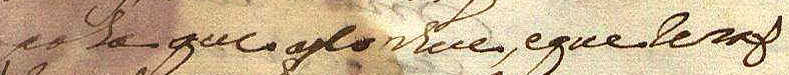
po ha que as conhece, e que Rezaõ
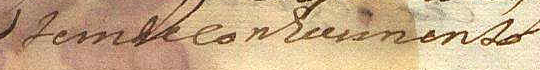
tem de conhecimento
